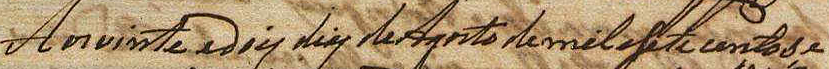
Aos vinte e dois dias de Agosto de mil e setecentos e
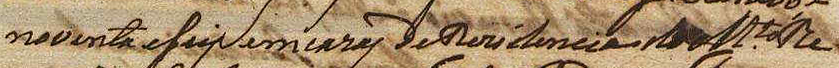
noventa e seis em cazas de Rezidencia de M.to Re
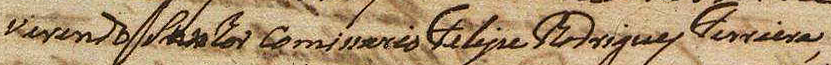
verendo Senhor Comissario Felipe Rodrigues Ferreira,
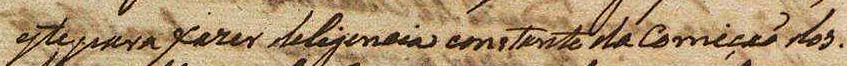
este para fazer deligencia constante da Comiçaõ dos
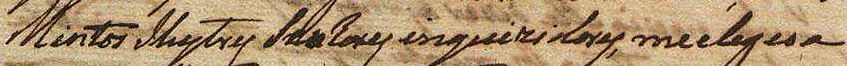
Mintos Ilustres Senhores inquizidores, me elegeo a
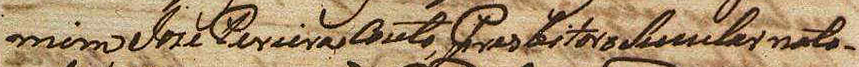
mim Ioze Pereira Couto, Presbitoro Secular noto
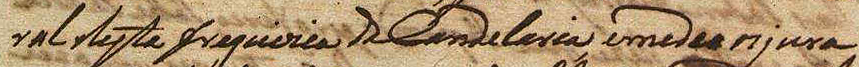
ral desta freguezia de Candelaria, e me deo os jura
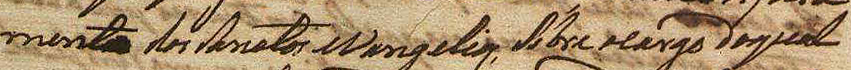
mento dos Sanctos eVangelios, sobre o cargo do qual
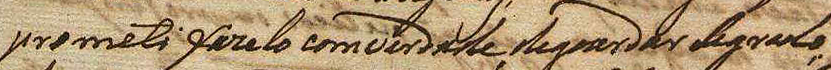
prometi fazelo com verdade, de goardar segredo,
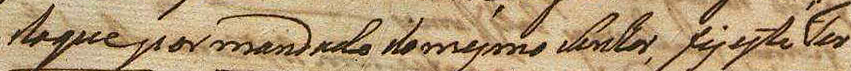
do que por mandado do mesmo Senhor, fis este Ter
